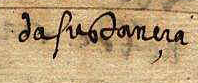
da sustancia
